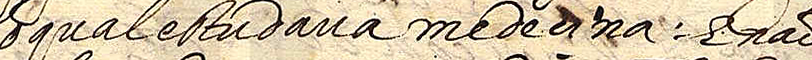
o qual estudaua medecina: E naõ
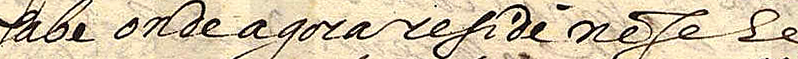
sabe onde agora reside nē se he
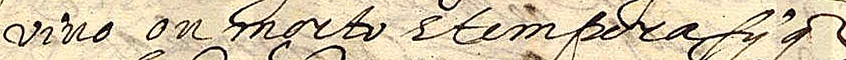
viuo ou morto E tem pera sy q̄
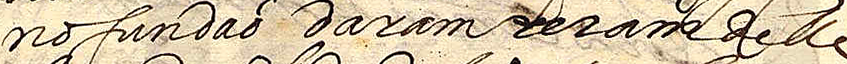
no fundaõ daram rezam delle
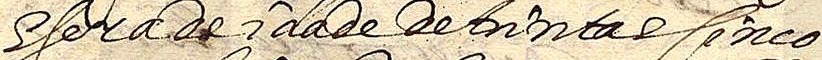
E sera de idade de trinta e Cinco
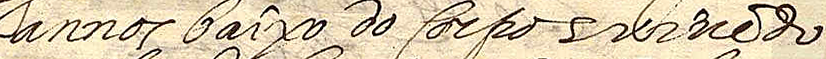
annos baixo do Corpo E viuēdo
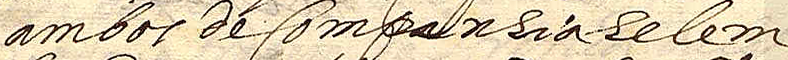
ambos de Companhia he lem
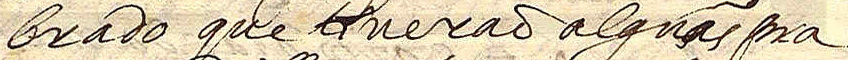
brado que tiueraõ alguās pra
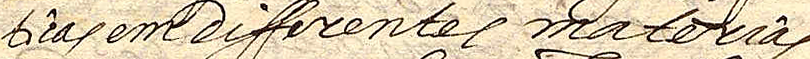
ticas em differentes materias
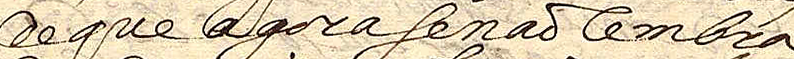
de que agora se naõ lembra
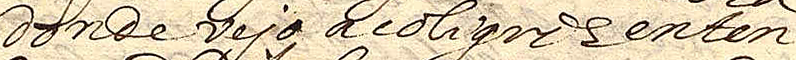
donde vejo a coligir E enten
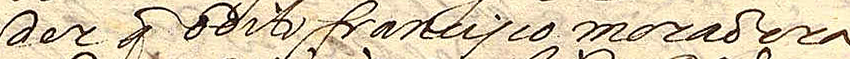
der q̄ o dito francisco moraõ era
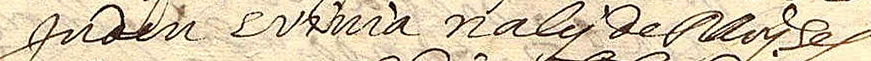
Judeu E viuia na lej de Moyses
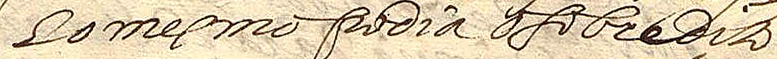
E o mesmo podia o sobredito
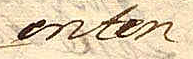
enten
